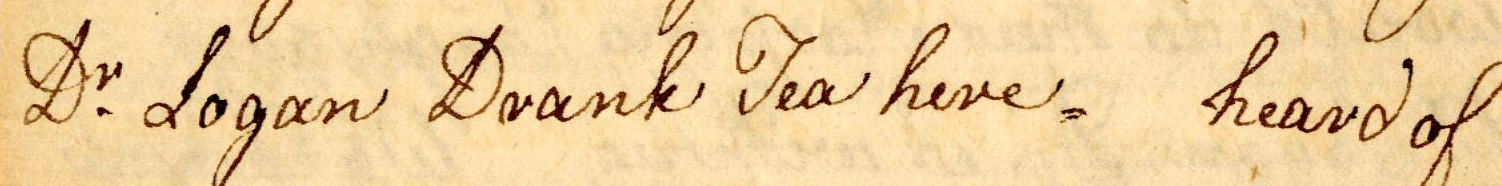D^r. Logan Drank Tea here. heard of
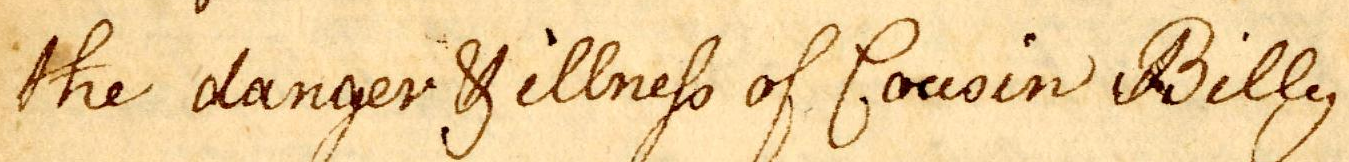the danger & illness of Cousin Billy
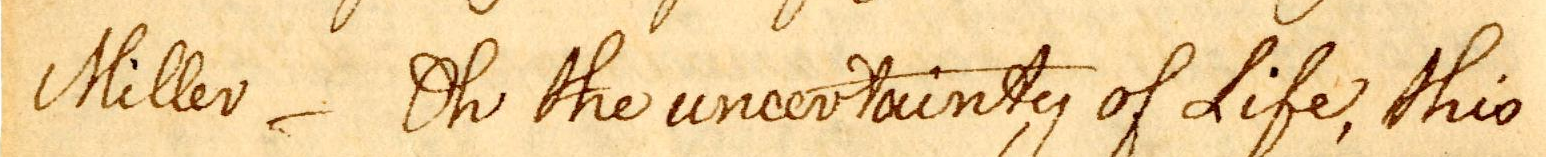Miller- Oh the uncertainty of Life, this
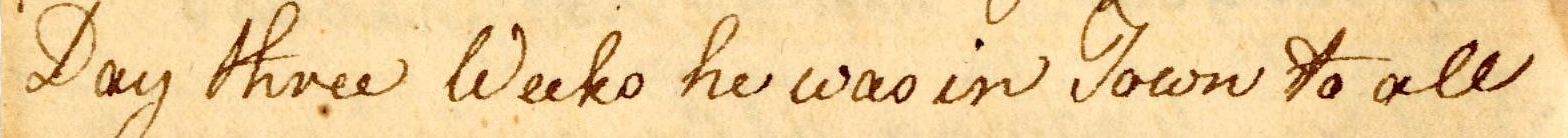Day three Weeks he was in Town to all
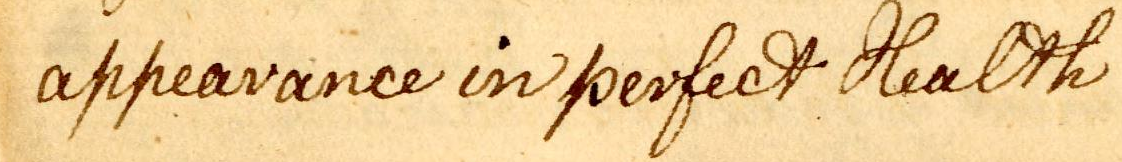appearance in perfect Health
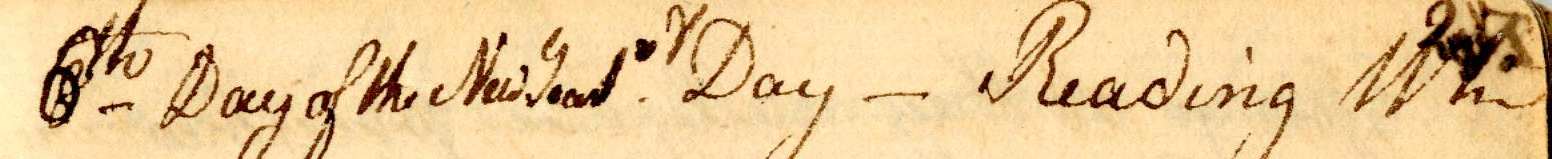6^th- Day of the New Year1^st Day- Reading Wm
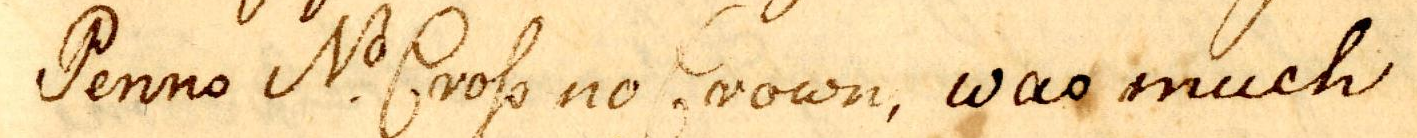Penns N^o. Cross no Crown, was much
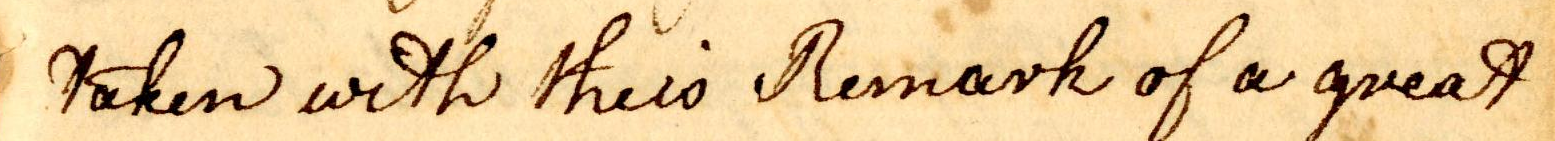taken with this Remark of a great
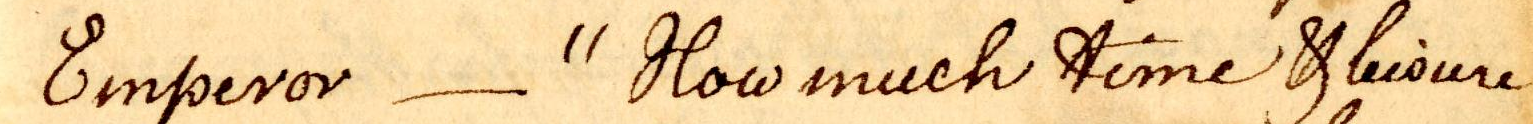Emperor- "How much time & leisure
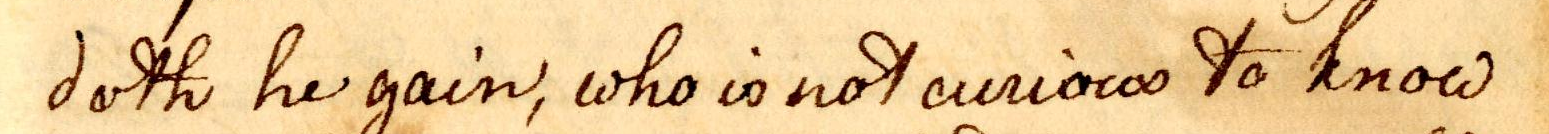doth he gain, who is not curious to know
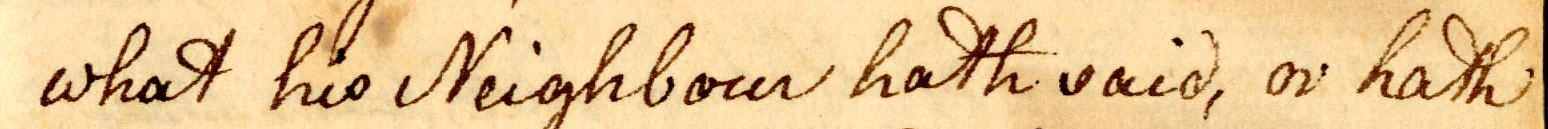what his Neighbour hath said, or hath
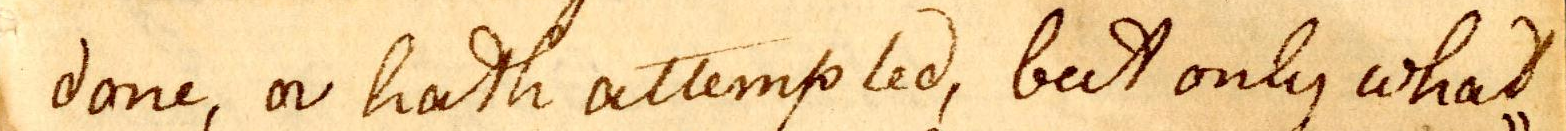done, or hath attempted, but only what
